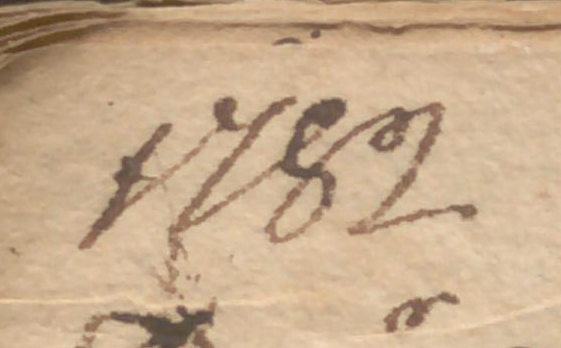1782
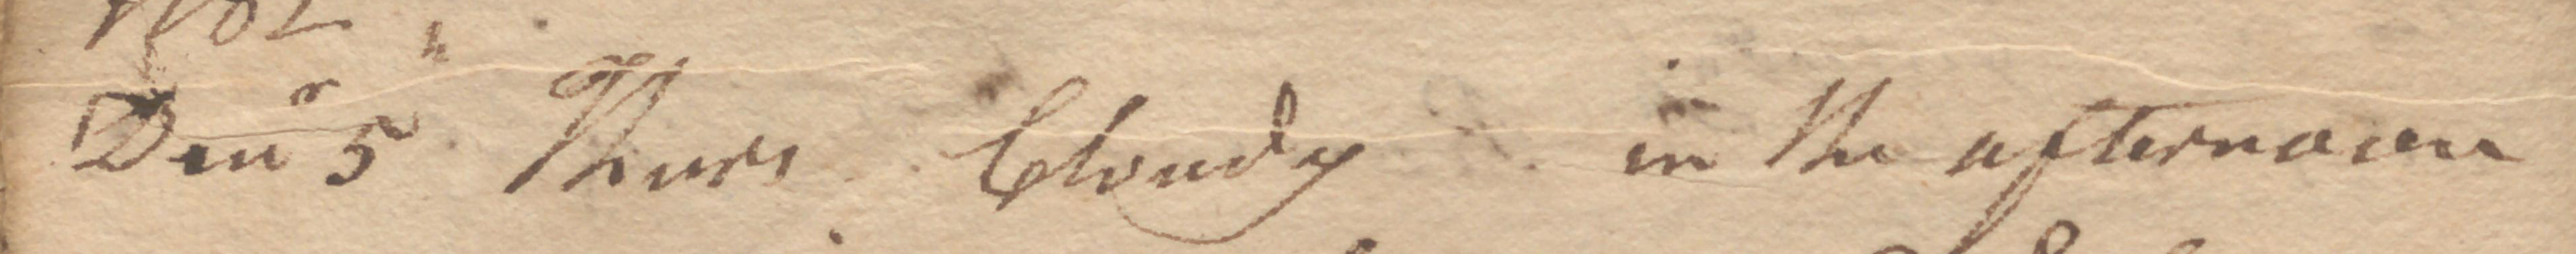Dec^r 5^h Thurs Cloudy in the afternoon
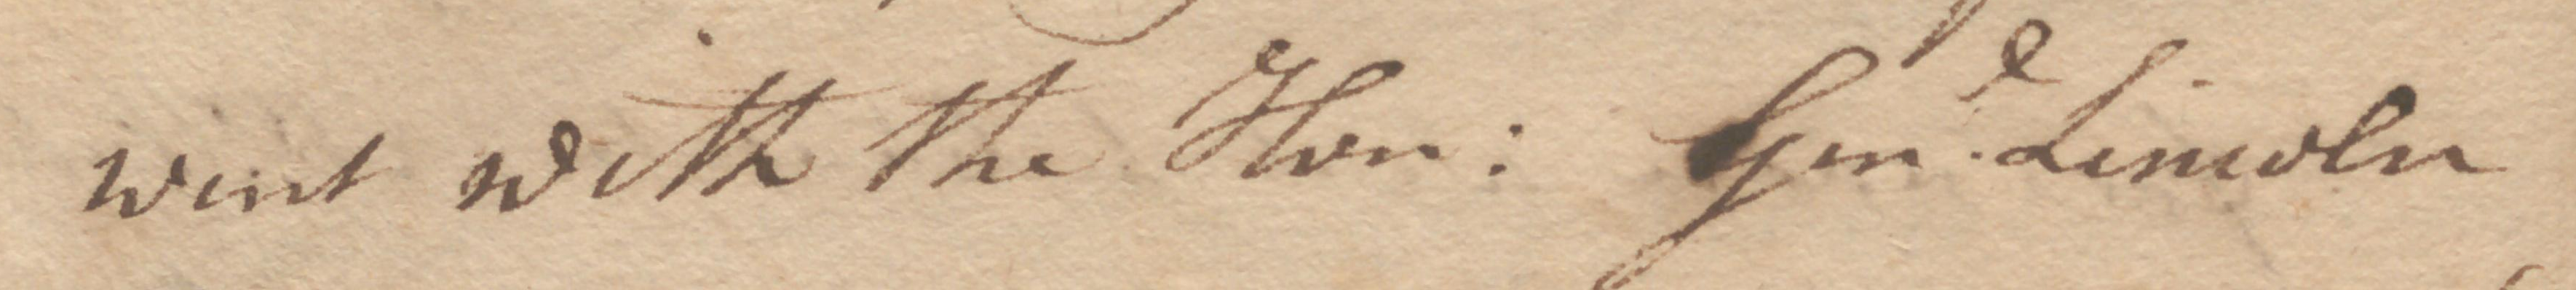went with the Hon: Gen^l. Lincoln
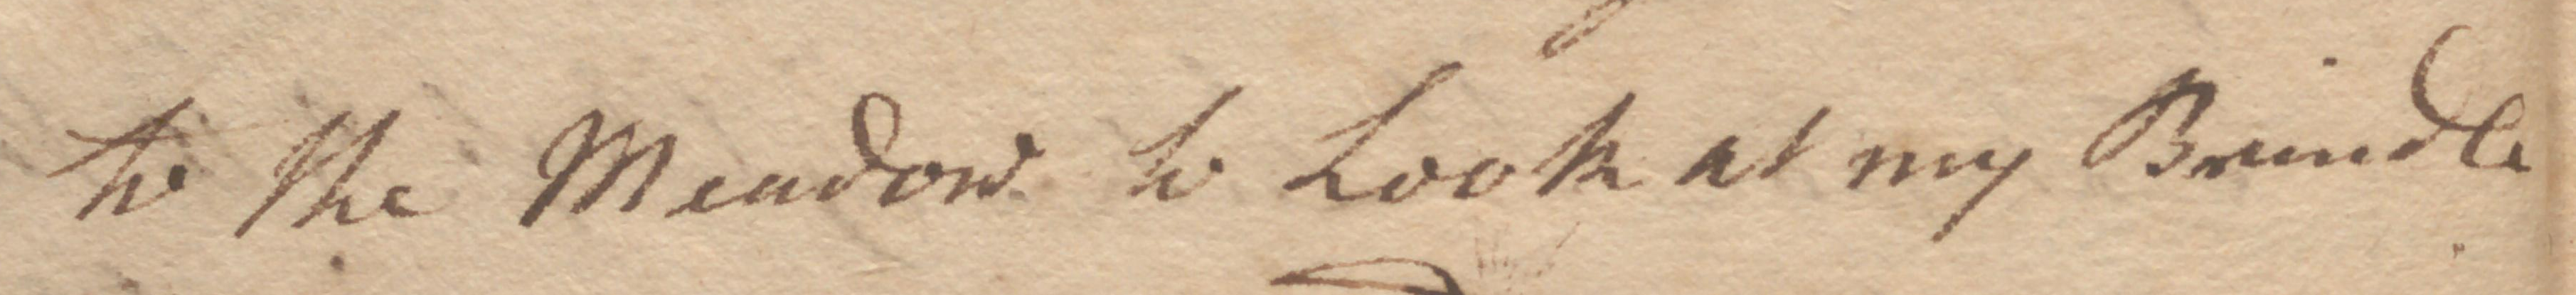to the Meadow to Look at my Brindle
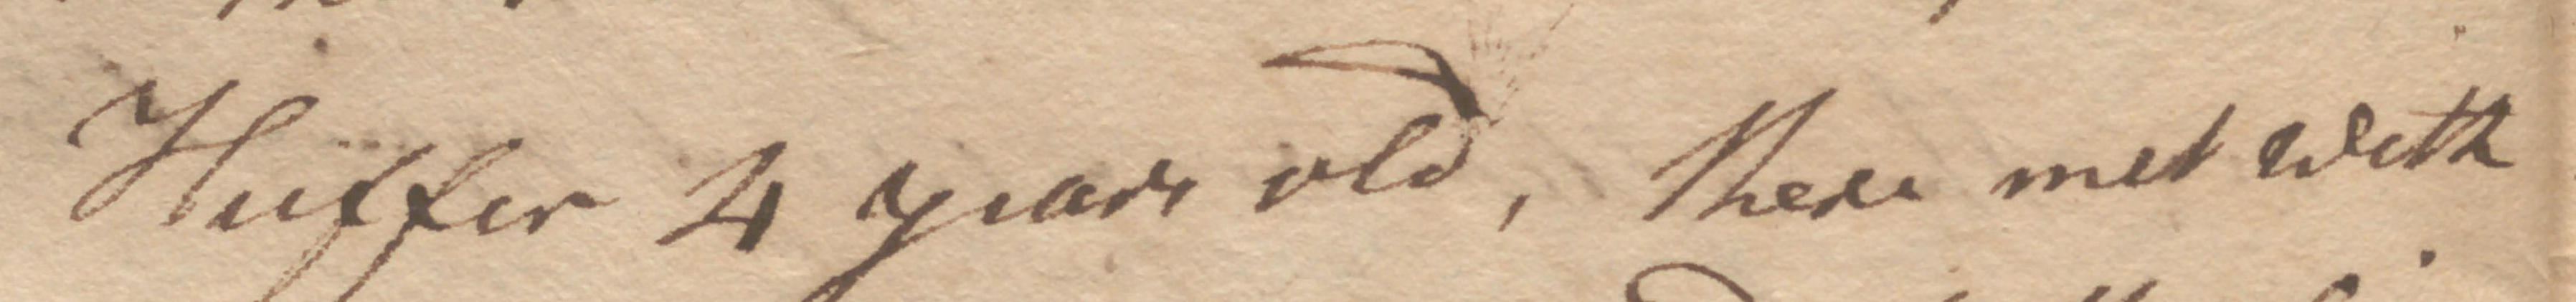Heiffer 4 years old, there met with
